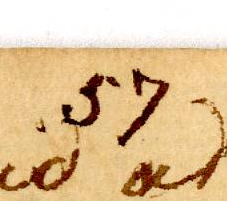57
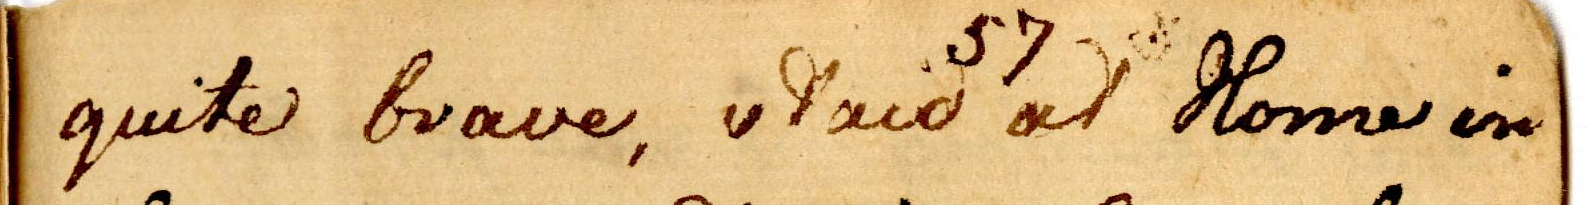quite brave, staid at Home in
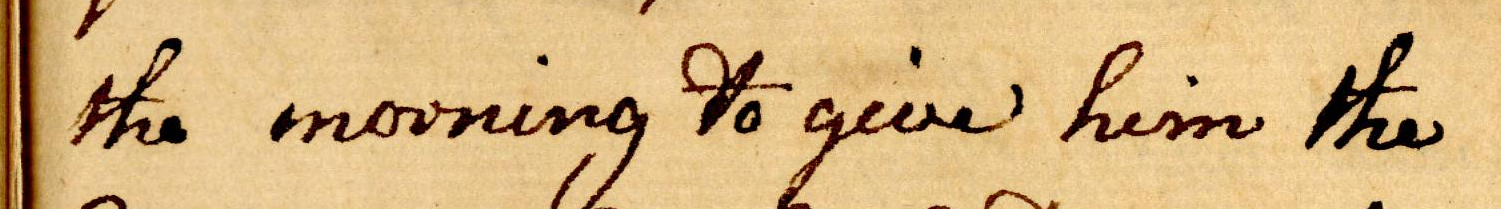the morning to give him the
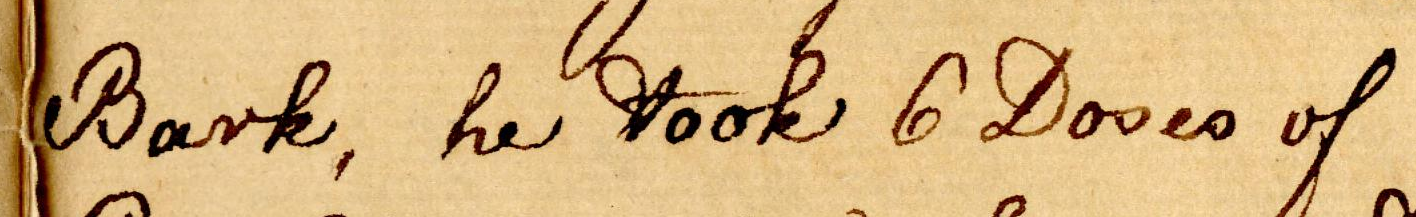Bark, he took 6 Doses of
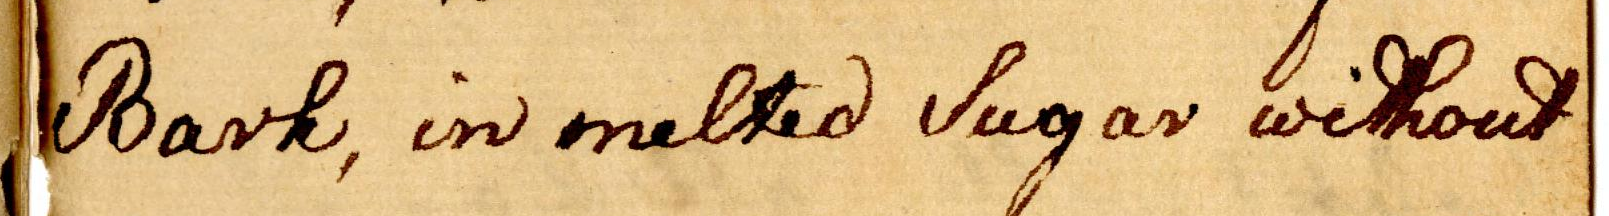Bark, in melted Sugar without
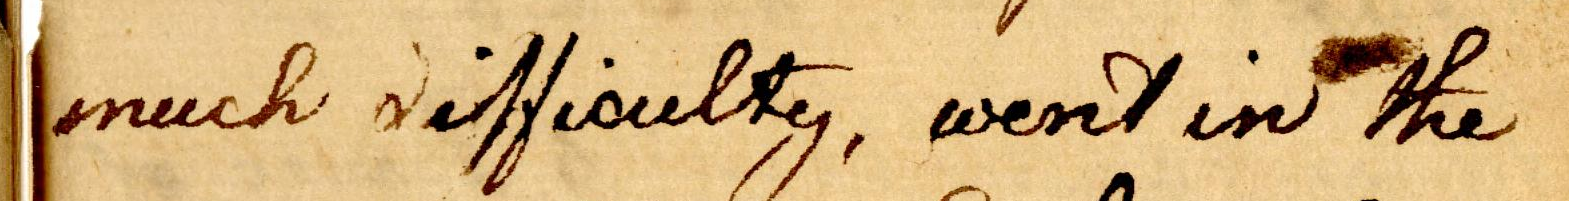much difficulty, went in the
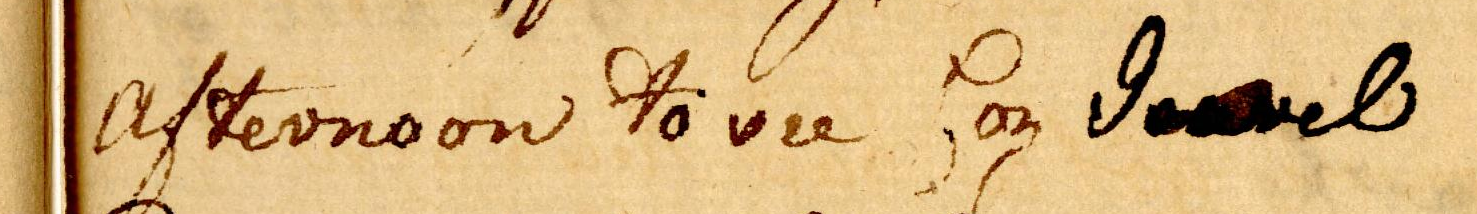Afternoon to see Coz Isarel
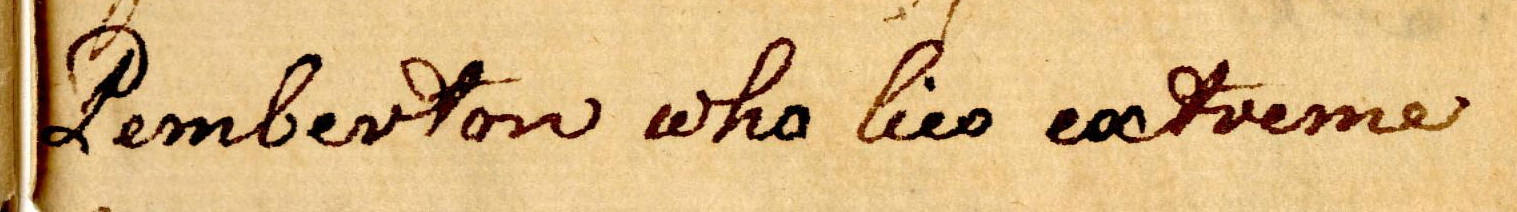Pemberton who lies extreme
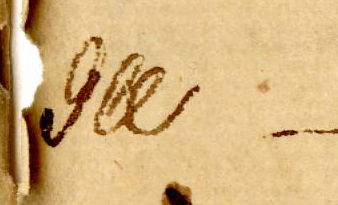Ill-
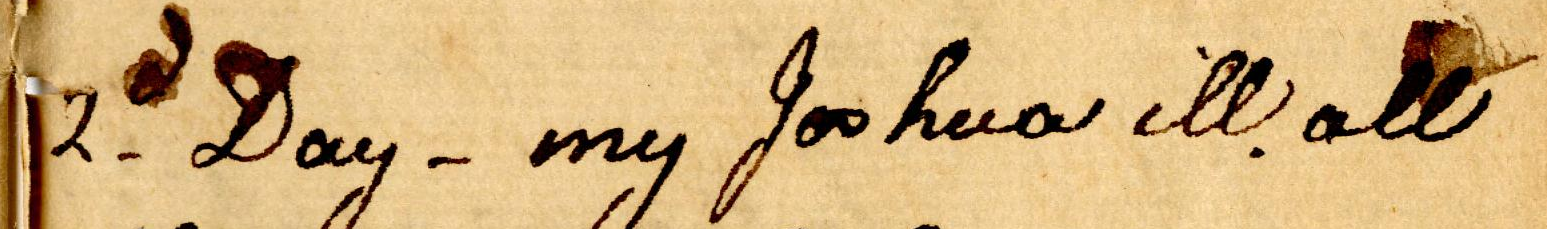2^d. Day- my Joshua ill all
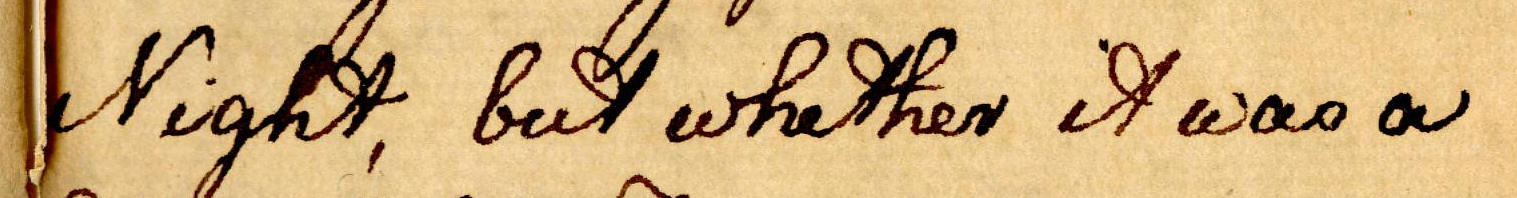Night, but whether it was a
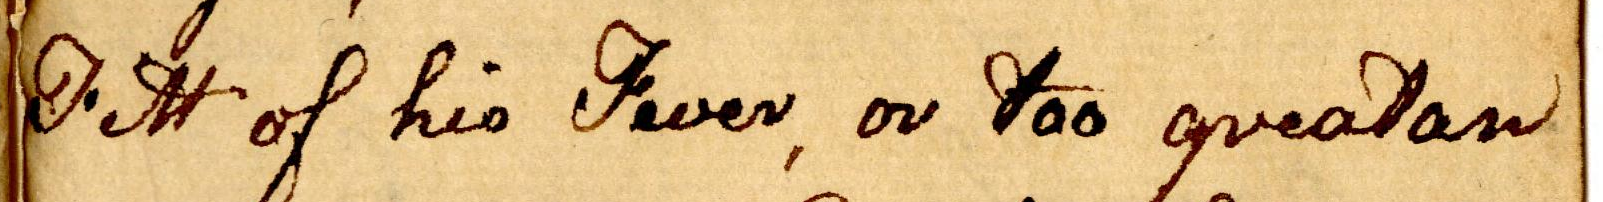Fitt of his Fever, or too great an
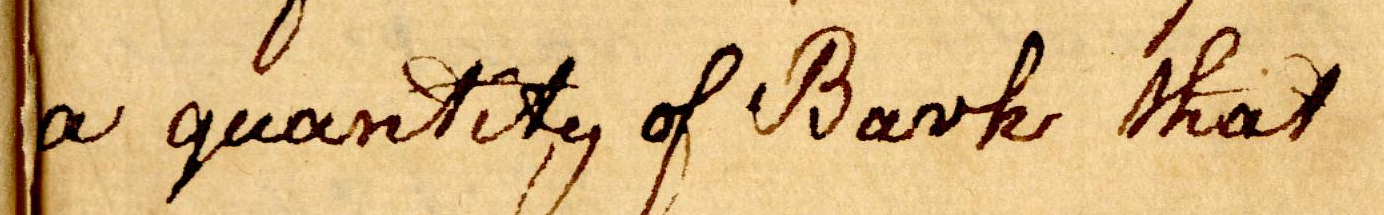a quantity of Bark that
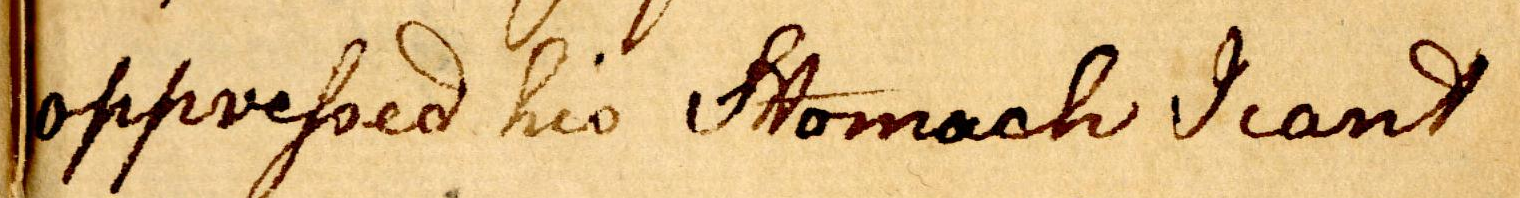oppressed his Stomach I cant
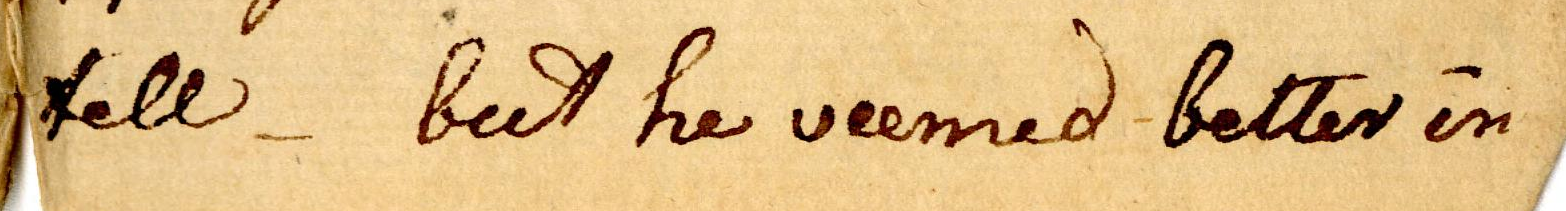tell- but he seemed better in
